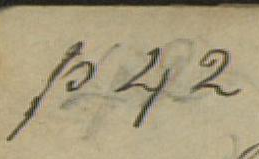P42
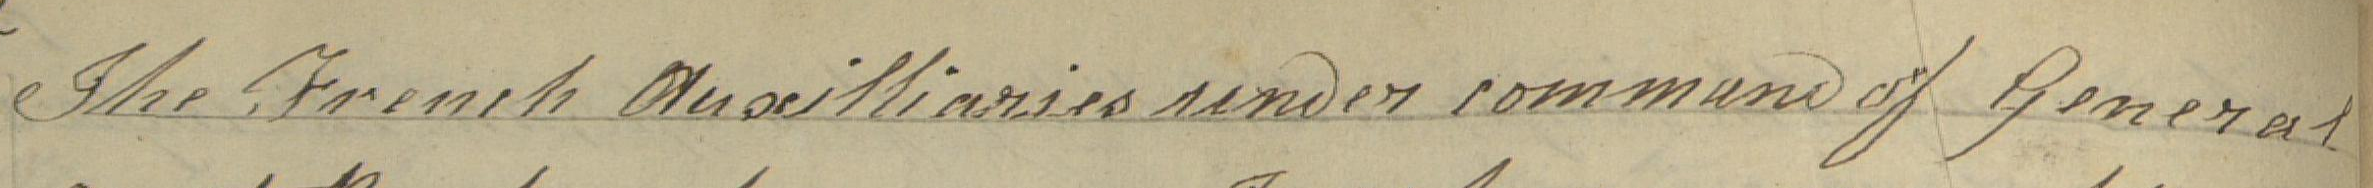The French Auxilliaries under command of General
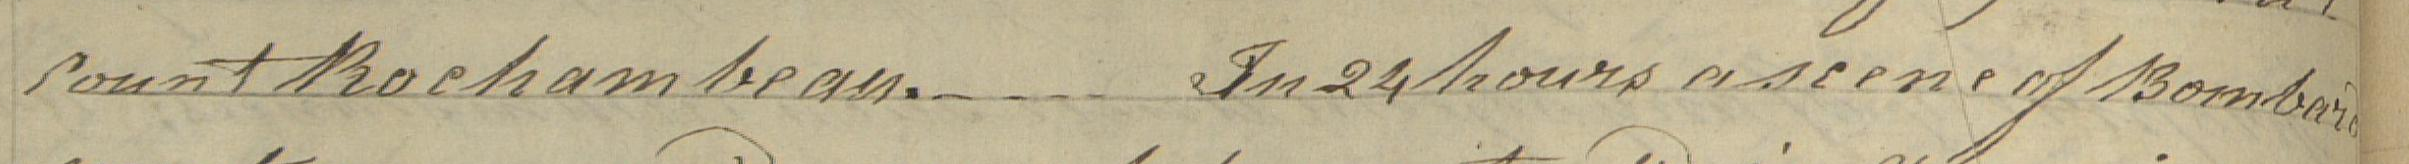Count Rochambeau. In 24 hours a scene of Bombard-
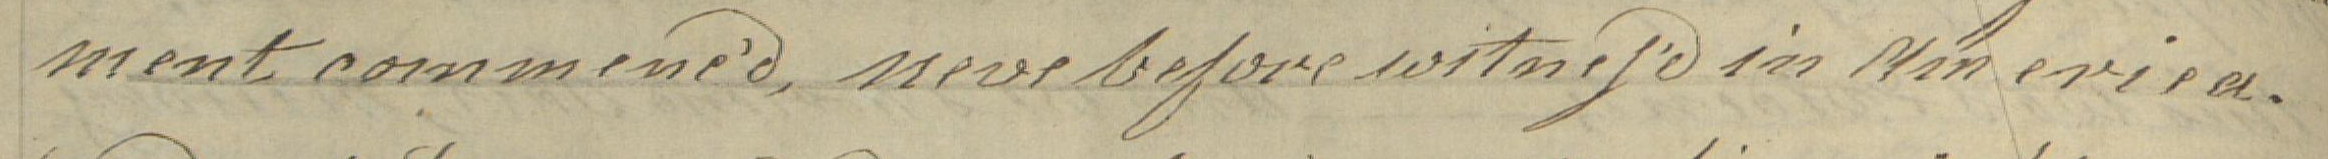-ment commenc'd neve before witnesd in America.
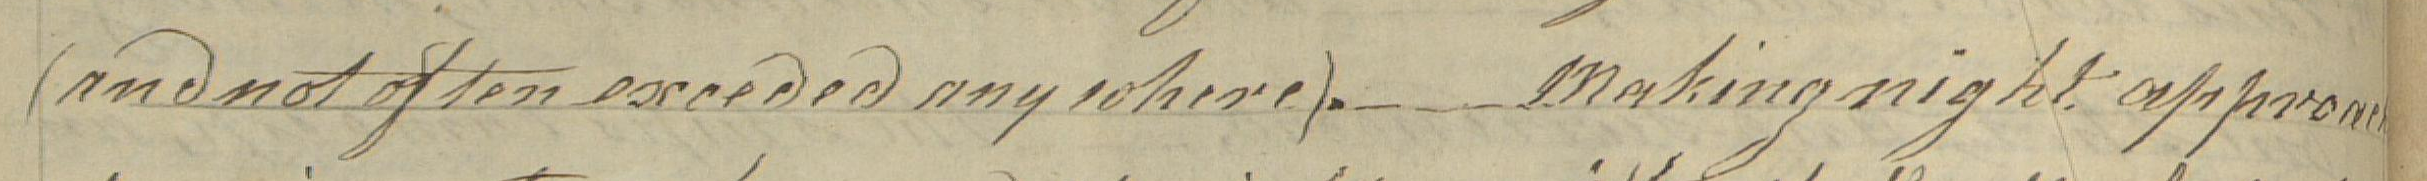(and not often exceded anywhere). Making night approac-
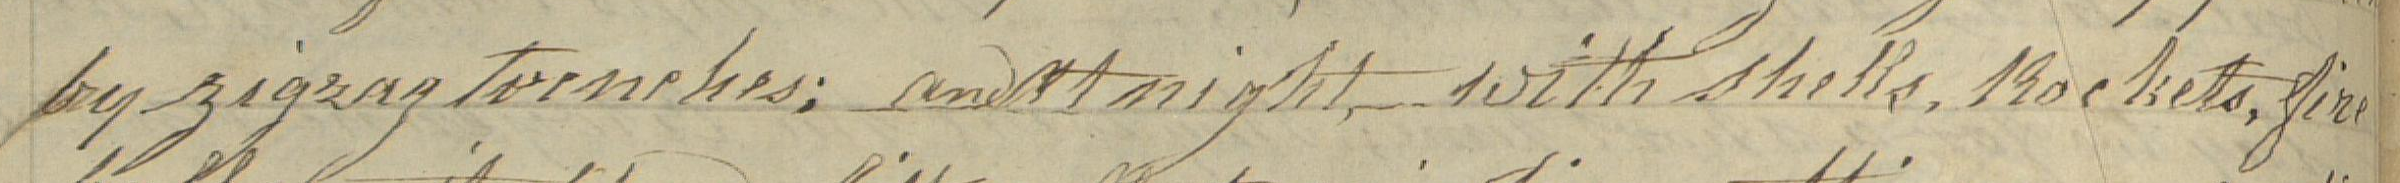by zigzag trenches; and at night, with shells, Rockets, fire
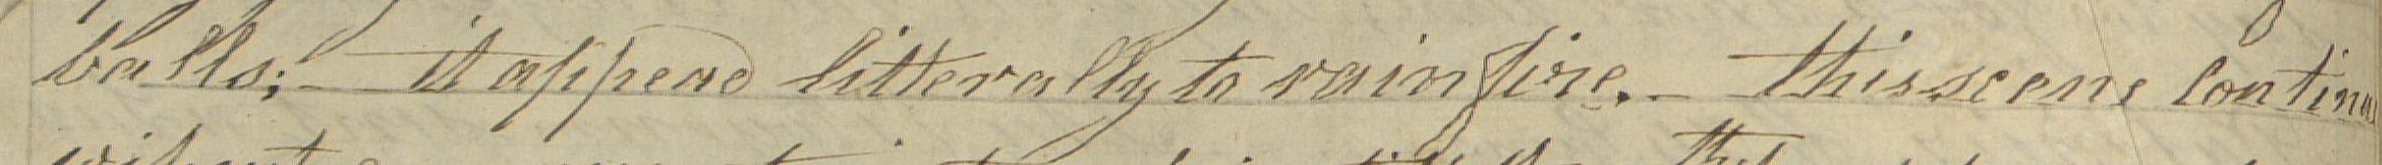balls; it appead litterally to rain fire. this scene contin-
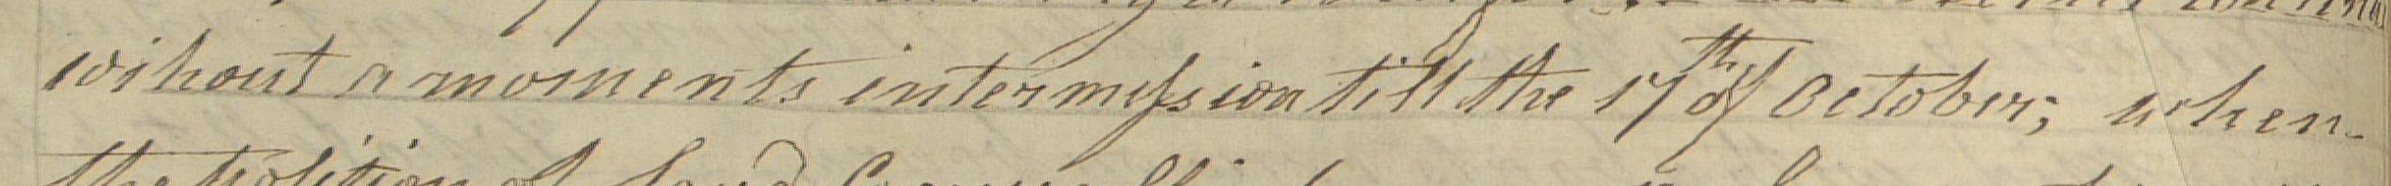without a moments intermission till the 17^th of October; when
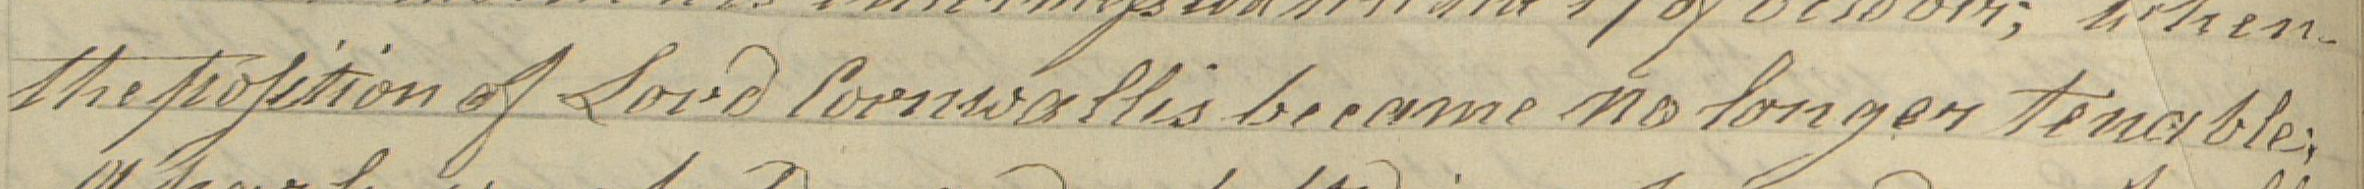the position of Lord Cornwallis became No longer tenable;
